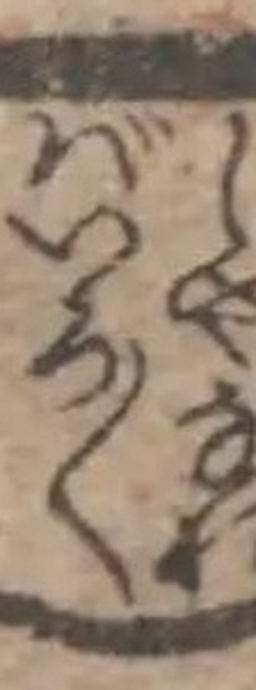バいろ〳〵
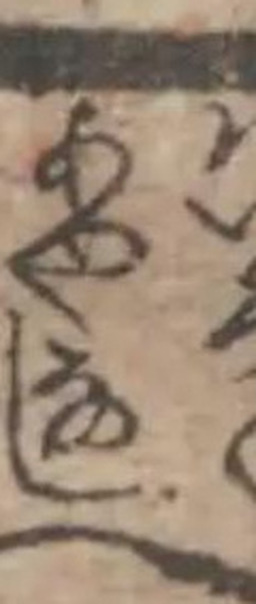あやなし
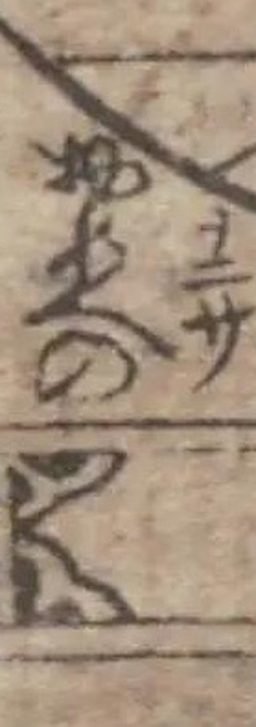おれへの
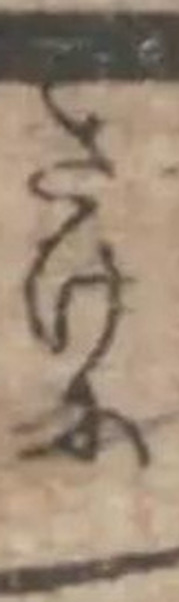さけに
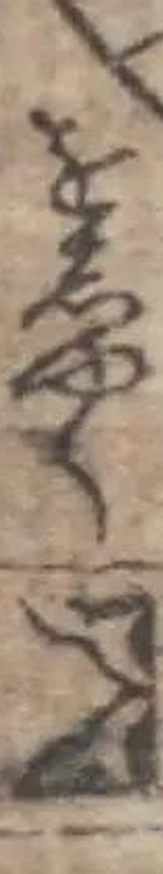おしやく
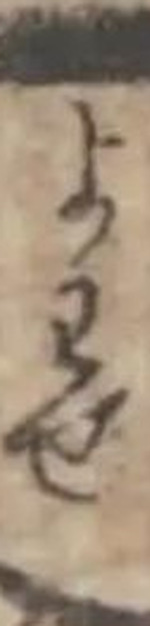よわせ
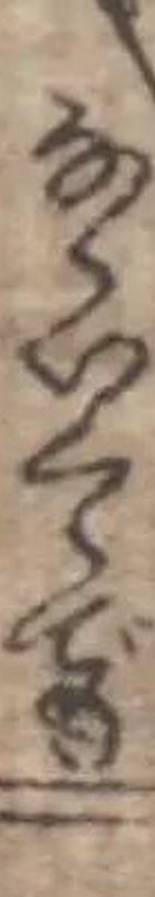ならいくらでも
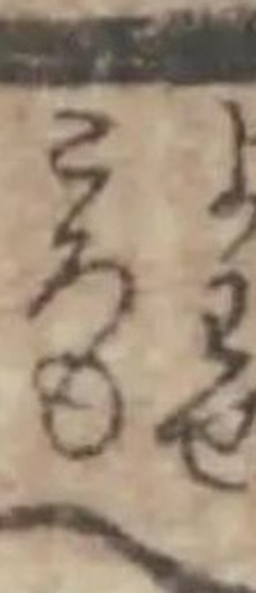ころも
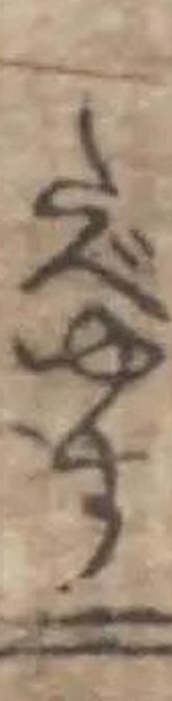たべやす
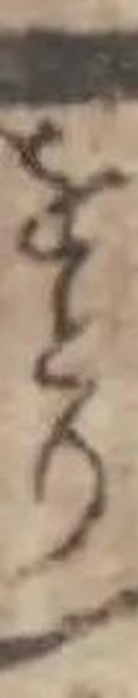をとり
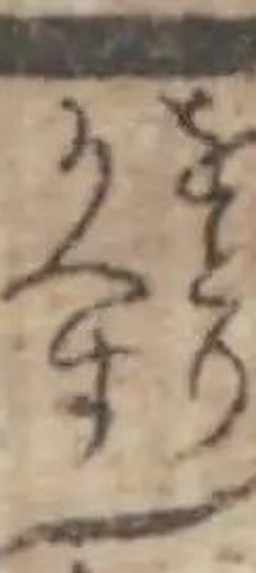かへす
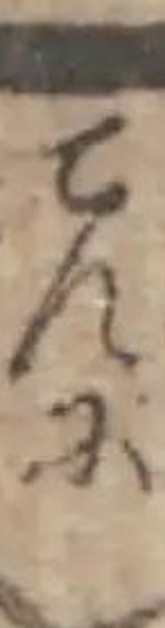てんに
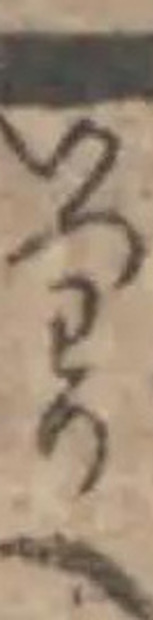いつわり
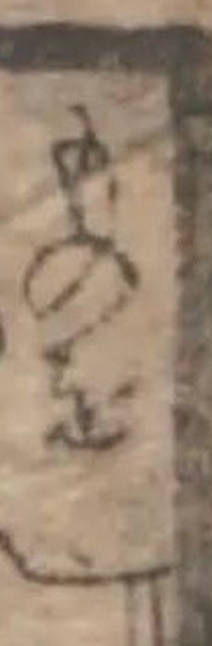ものを
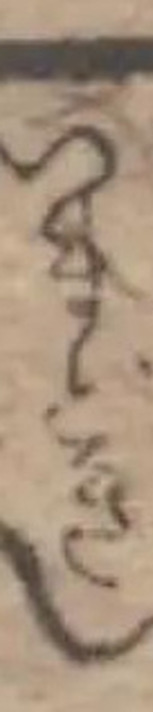いまどき
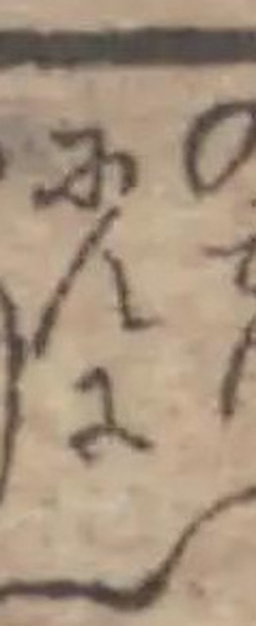にんに
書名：草紙の曙 3巻
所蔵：国立国会図書館 National Diet Library, JAPAN
